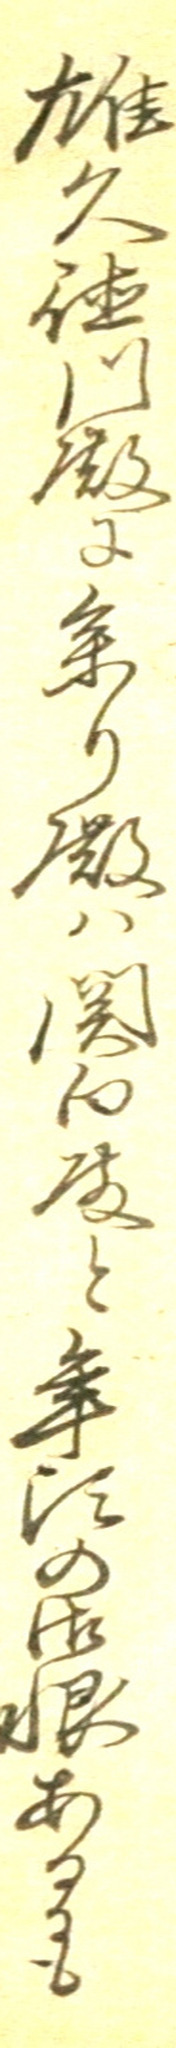雄久徳川殿に参り殿は関白殿と年頃の御恨あるにも
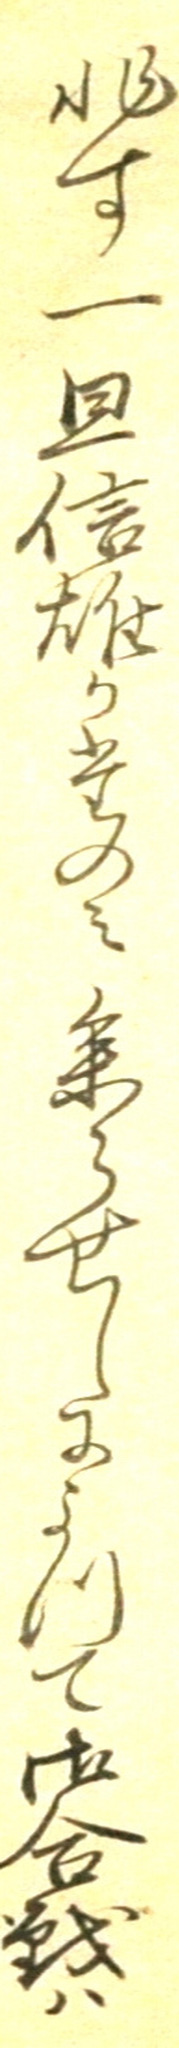非す一旦信雄かとのみ参らせしによつて御合戦は
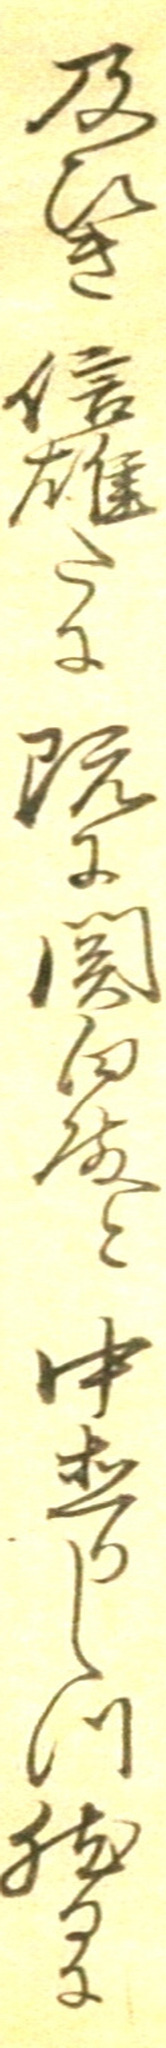及ひき信雄たに既に関白殿と中直りしつ然るに
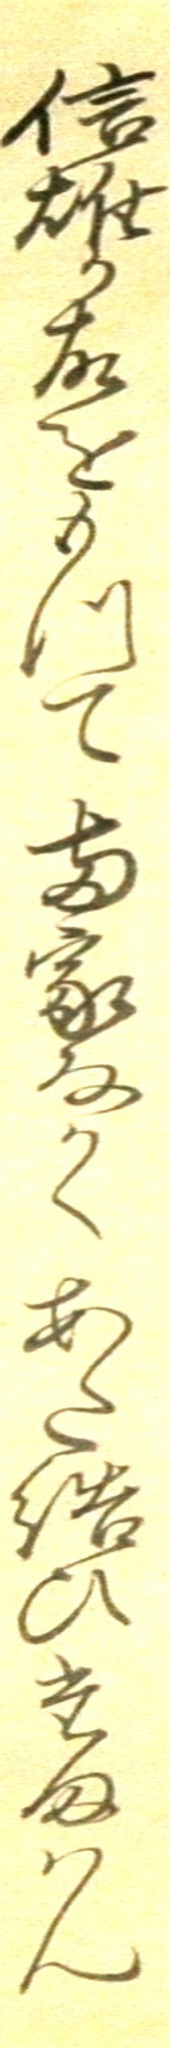信雄か故をもつて両家なかくあた結ひたまはん
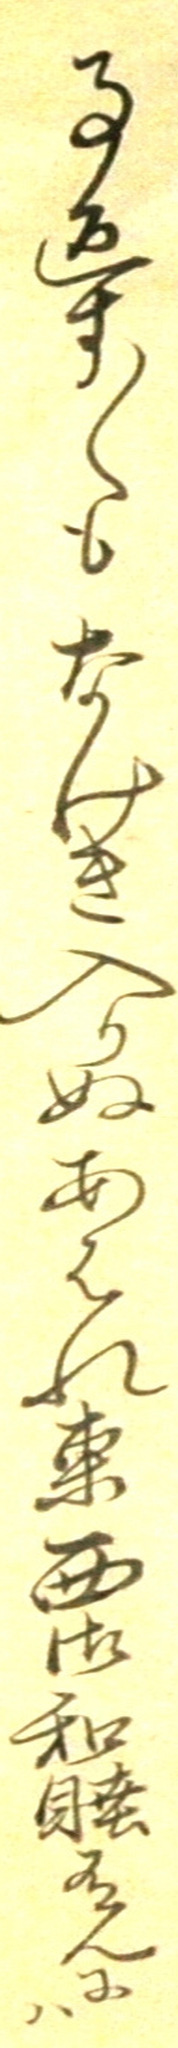事返す〳〵もなけき入りぬあはれ東西御和睦有んには
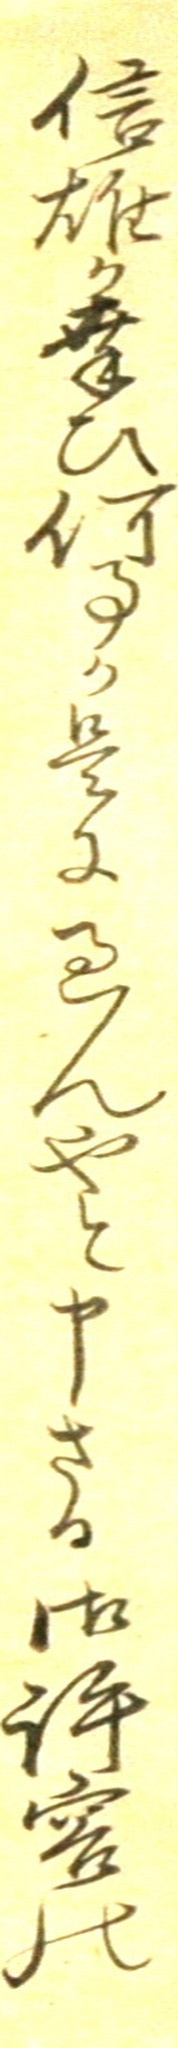信雄か幸ひ何事か是に過んやと申さる御許容の

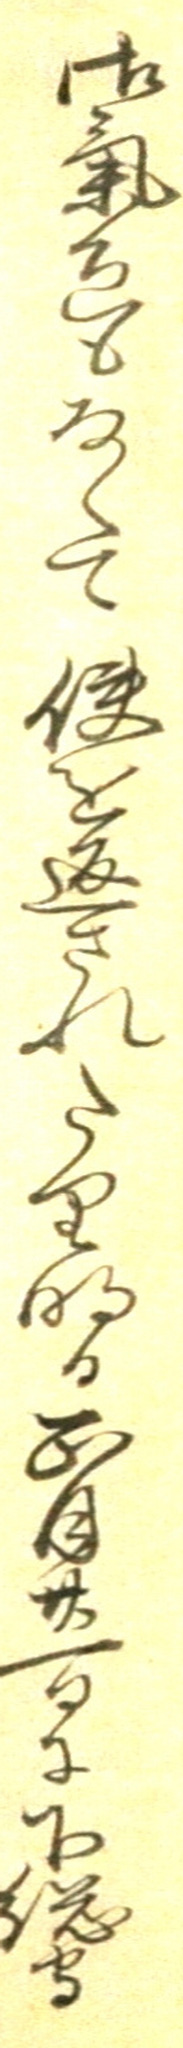御気色もなくて使を返されたり明る正月廿一日に下総守
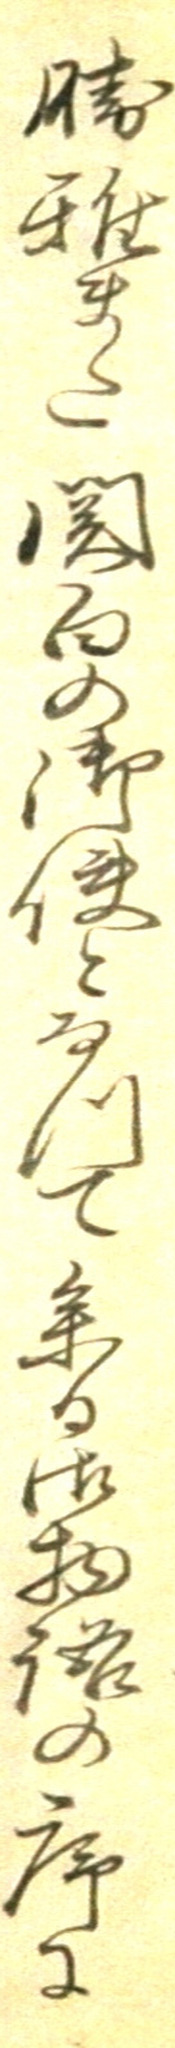勝雅また関白の御使となつて参る御物語の序に
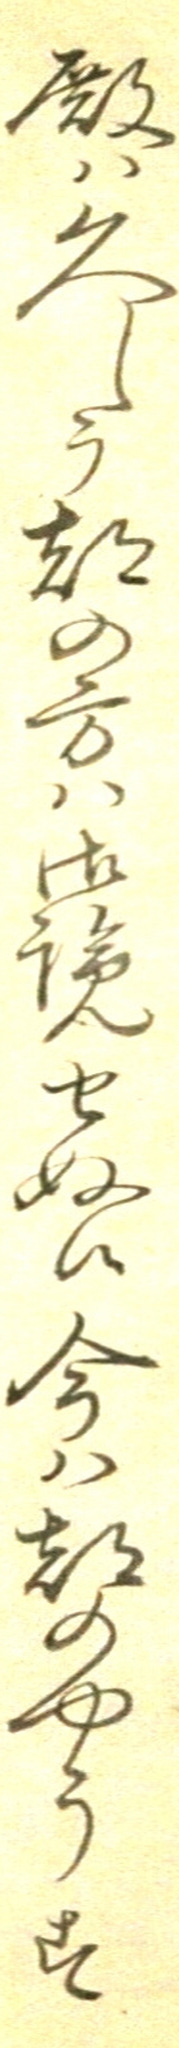殿は久しう都の方は御覧せぬ候今は都のやうす
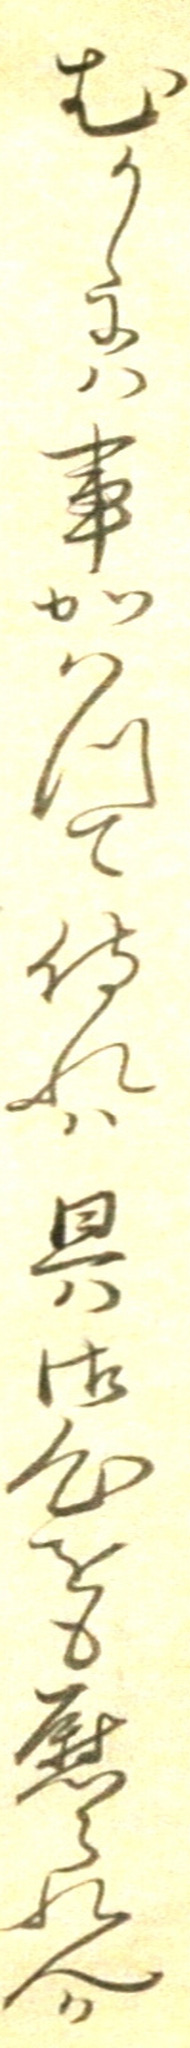むかしには事かはつて侍れは且は御心をも慰られんか
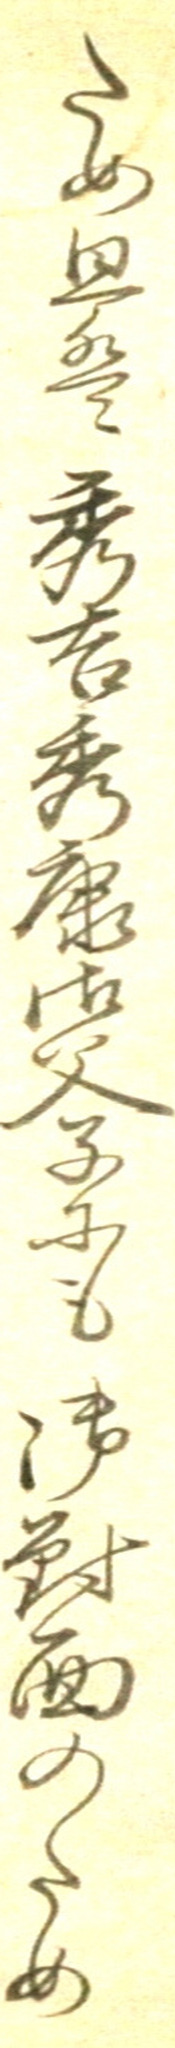ため且は秀吉秀康御父子にも御対面のため
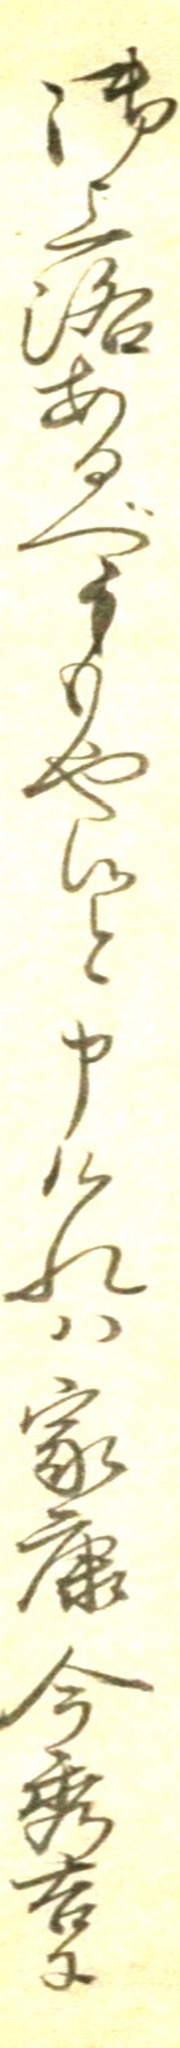御上洛あるべうもや候と申けれは家康今秀吉に
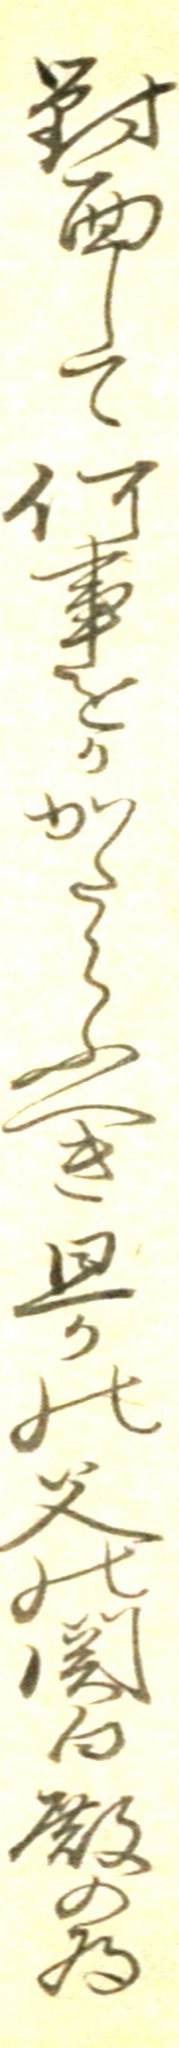対面して何事をかかたらふへき且かの父の関白殿の為
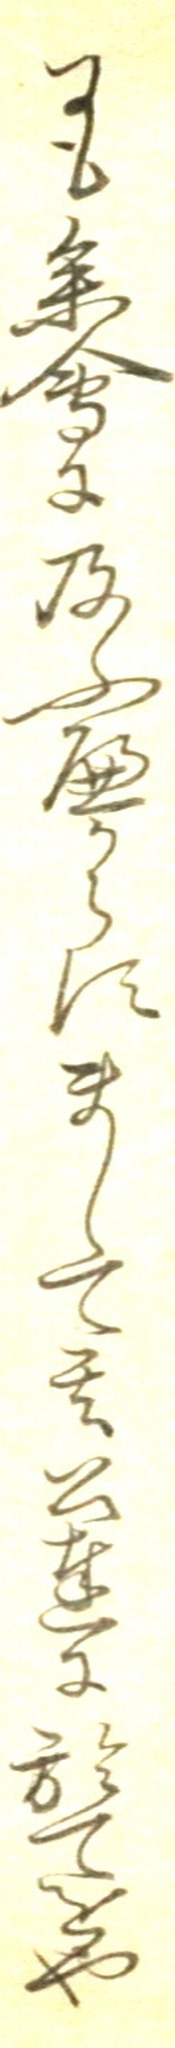にも参会に及ふへからすまして其公達に於てをや
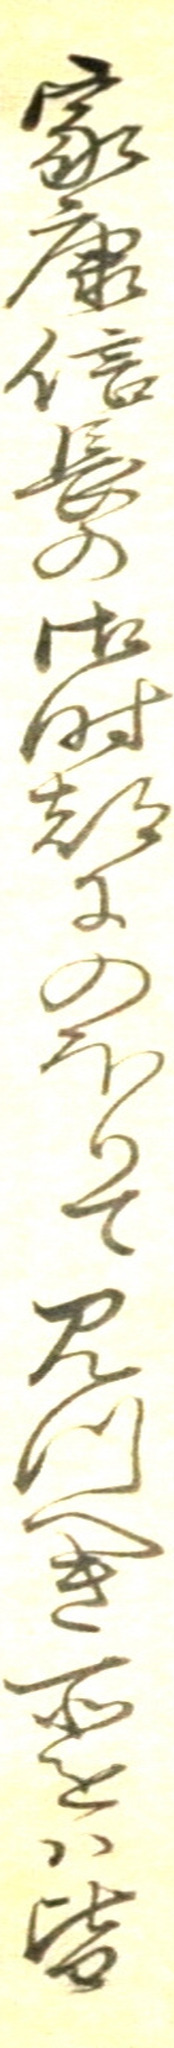家康信長の御時都にのほりて見つへき所をは皆
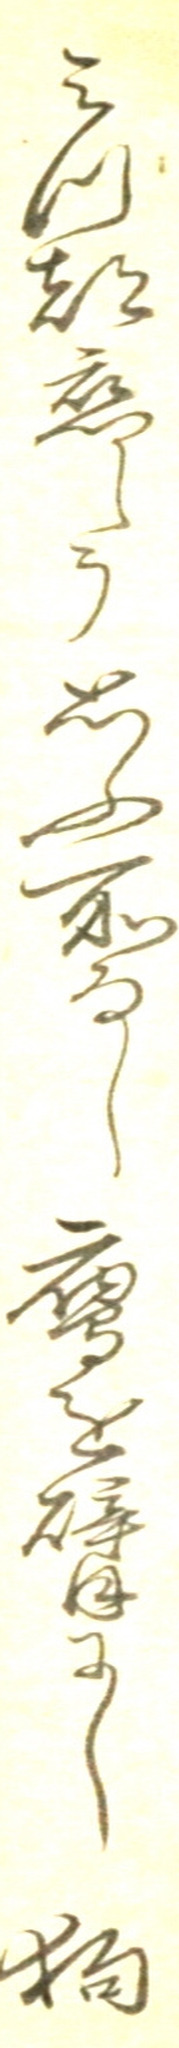みつ都恋しう思ふ所なし鷹を臂にし狗
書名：藩翰譜（一）
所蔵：伊那市立高遠町図書館・合同会社AMANE
